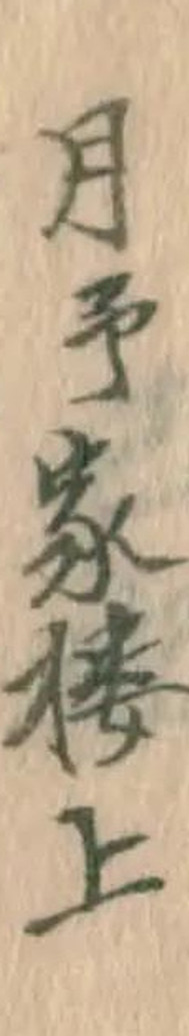月予家楼上
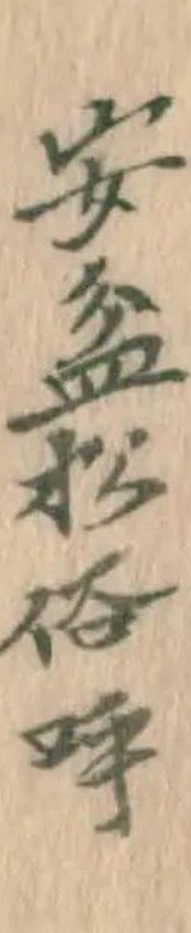安盆松俗呼
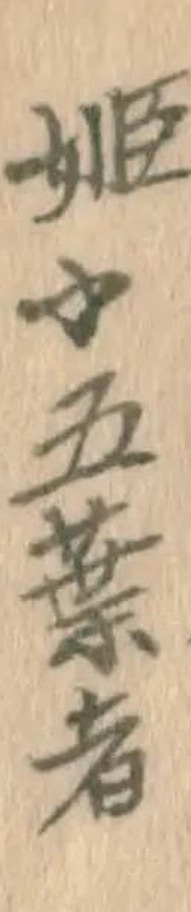姫尓五葉者
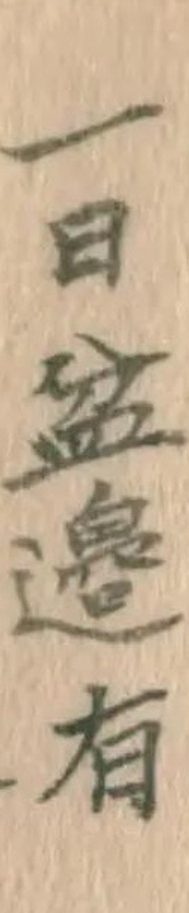一日盆邉有
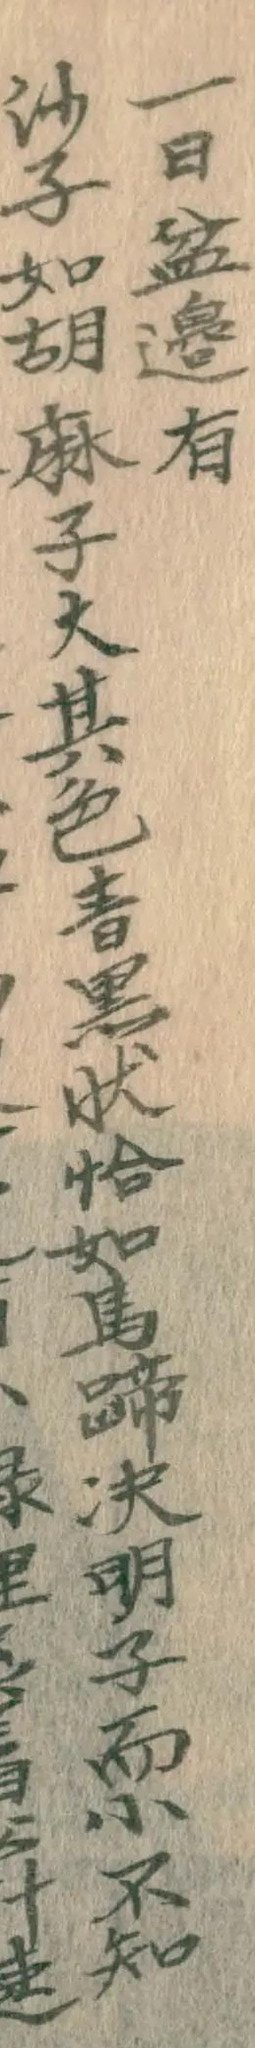沙子如胡麻子大其色青黒状恰如馬蹄决明子而小不知
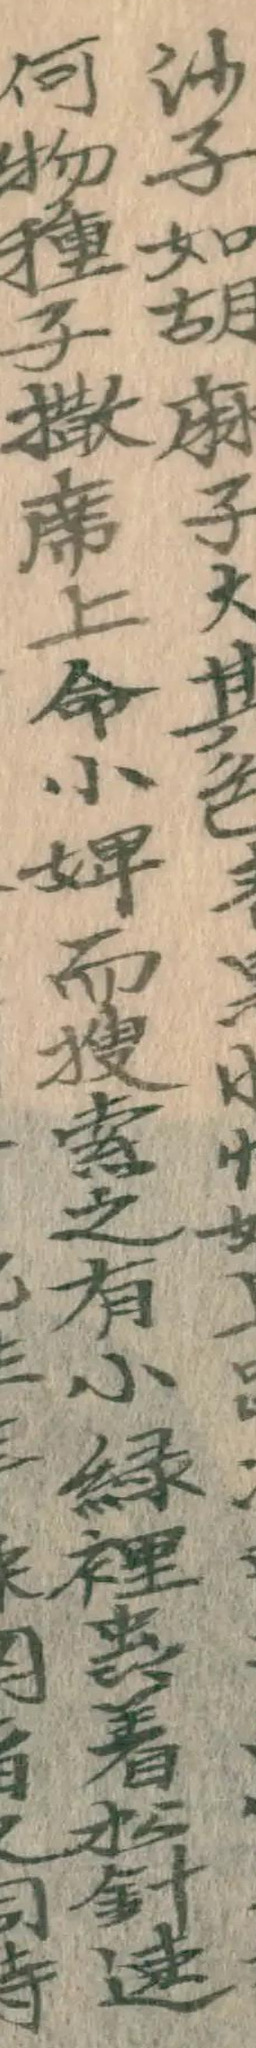何物種子撒席上命小婢而捜索之有小緑裡蟲着松針速
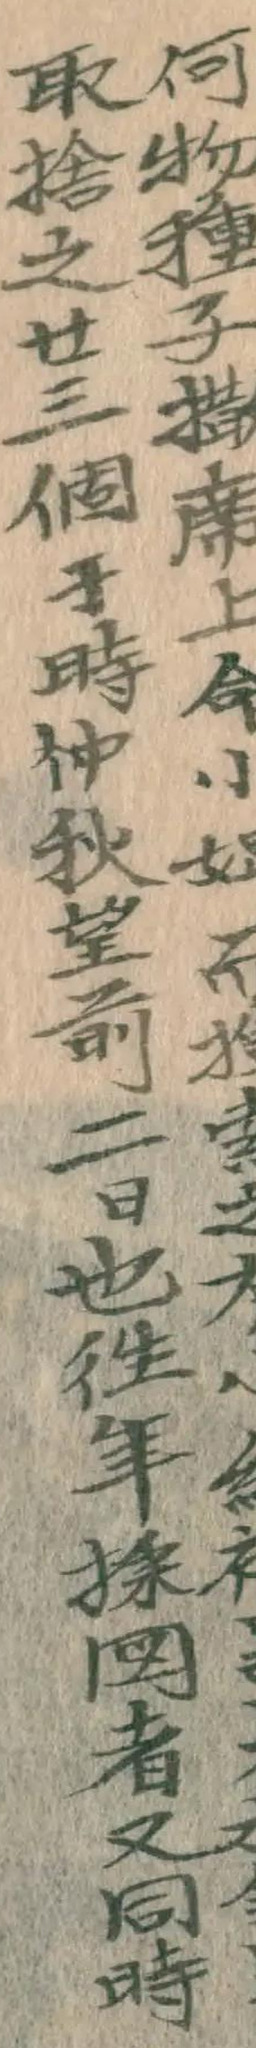取捨之廿三個于時仲秋望前二日也往年採図者又同時
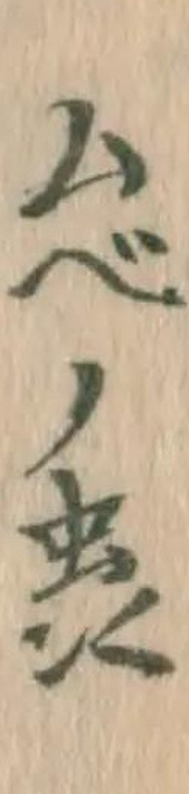ムベノ蟲
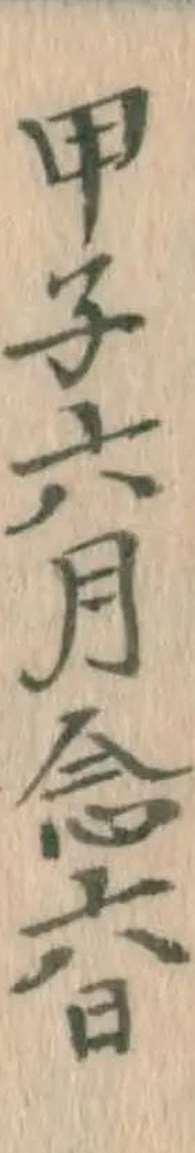甲子六月念六日
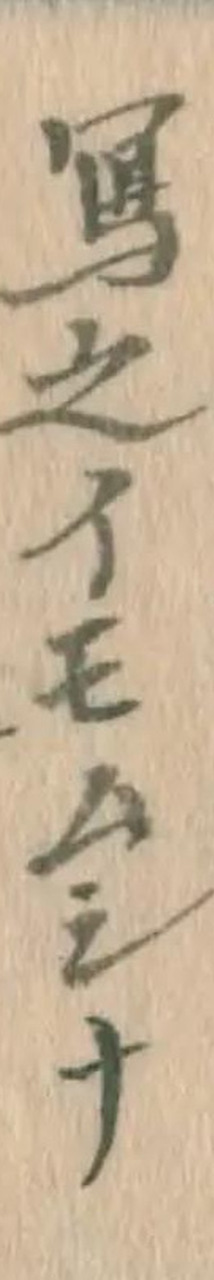冩之イモムシナ
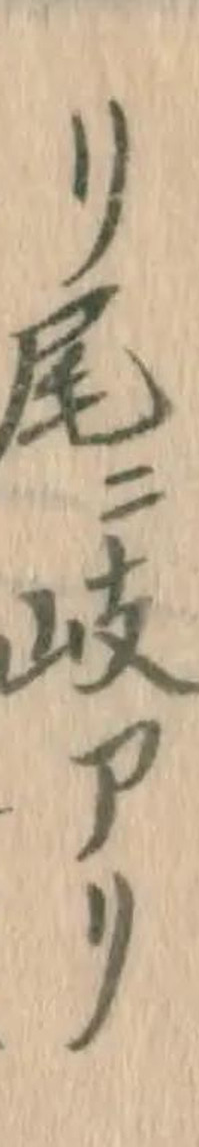リ尾ニ岐アリ
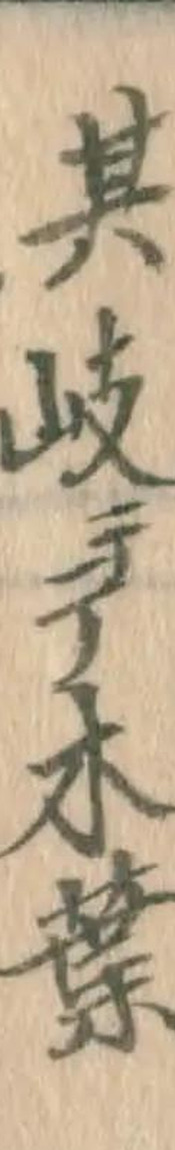其岐ニテ木葉
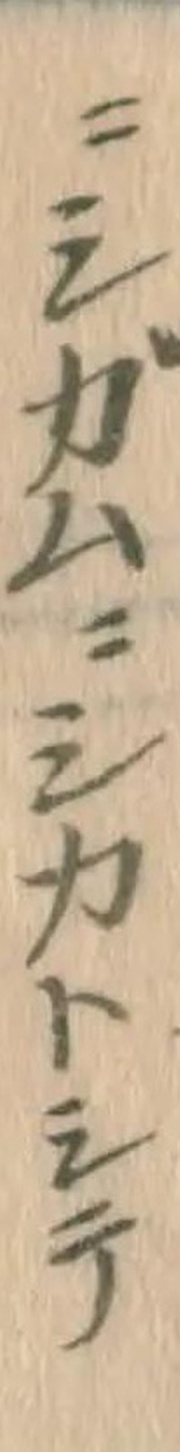ニシガムニシカトシテ
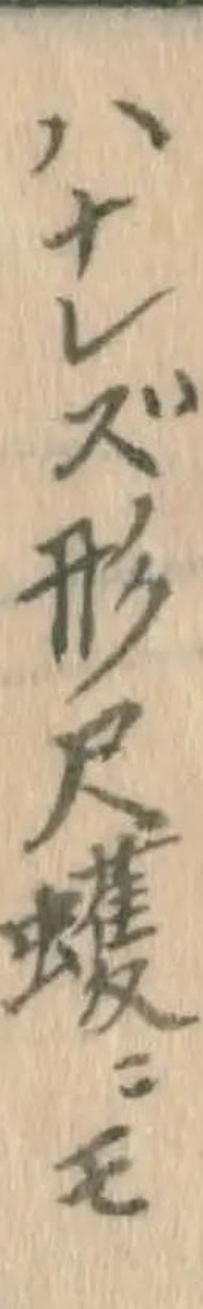ハナレズ形尺蠖ニモ
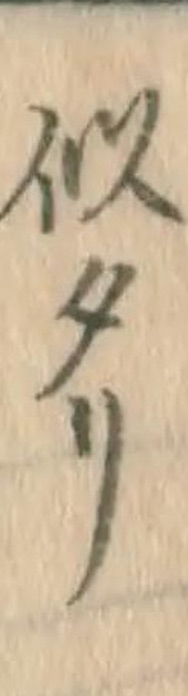似タリ

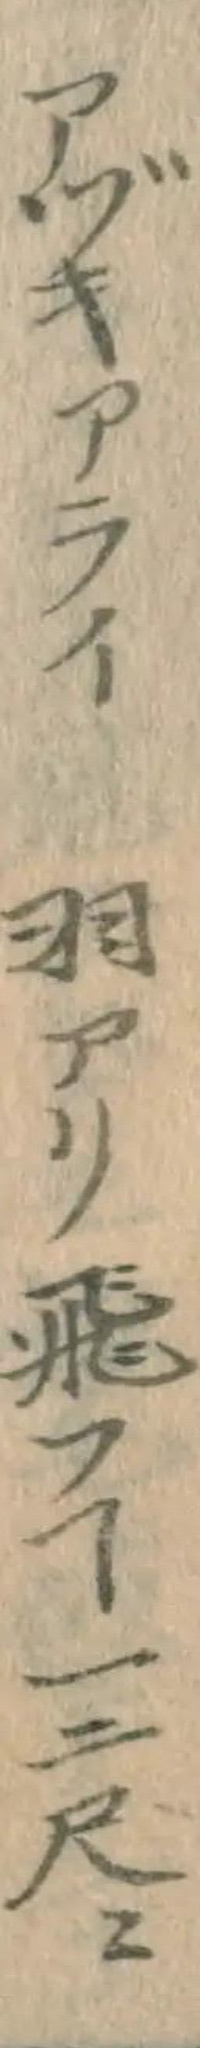アヅキアライ羽アリ飛フコト一二尺ニ
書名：千蟲譜 3巻. [1]
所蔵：国立国会図書館 National Diet Library, JAPAN
